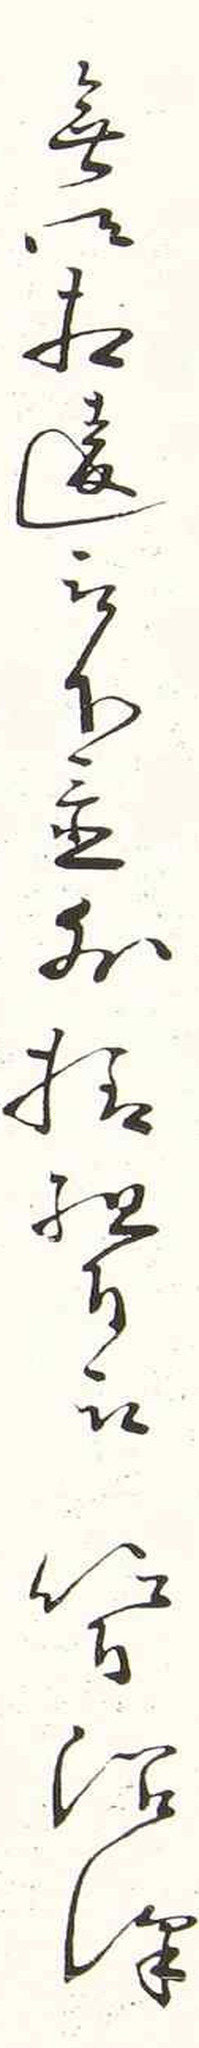無御相違被下置外様組付被仰付沼沢
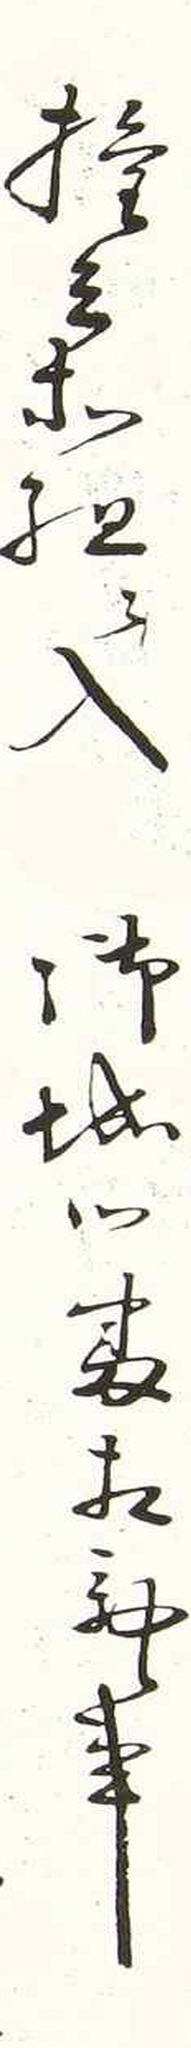権兵衛組ニ入御城御番相勤候事
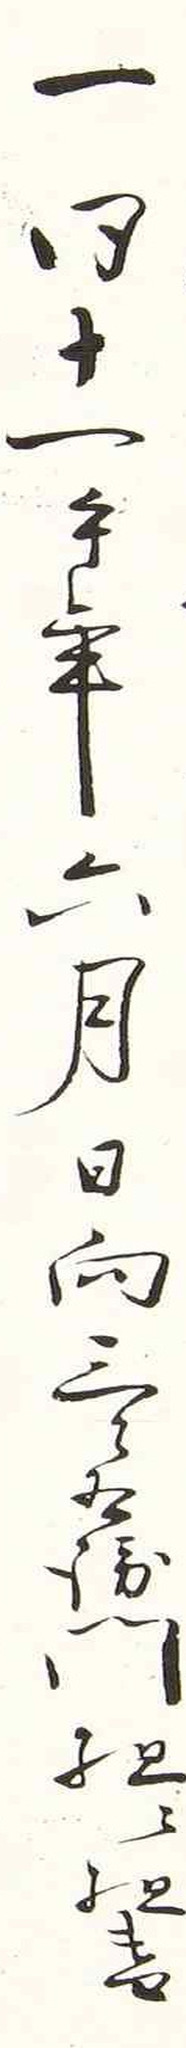一同十一午年六月日向三郎右衛門組ニ組替
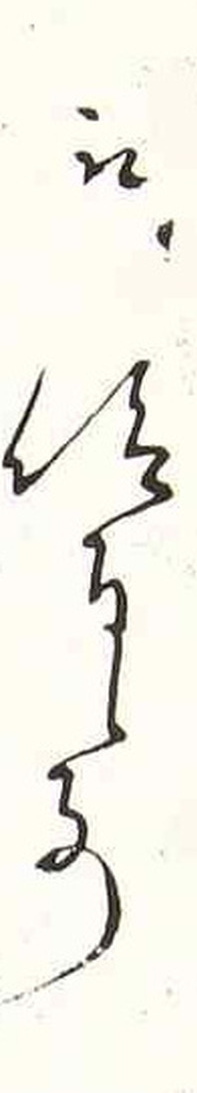被仰付候事
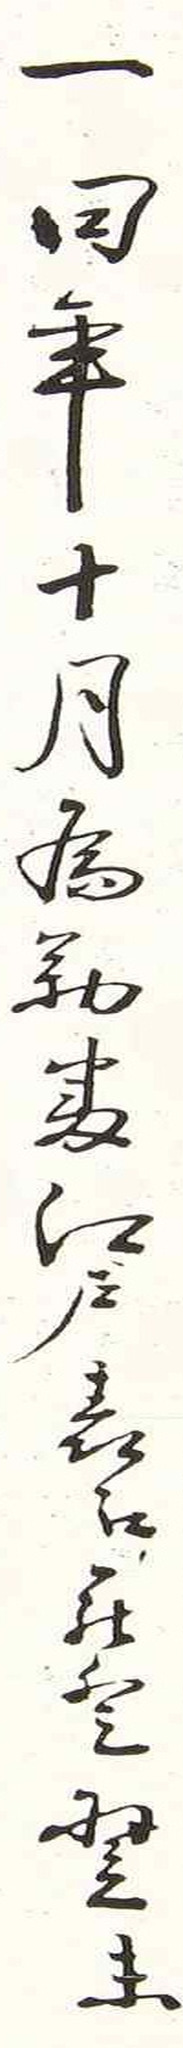一同年十月為勤番江戸表江罷登翌未
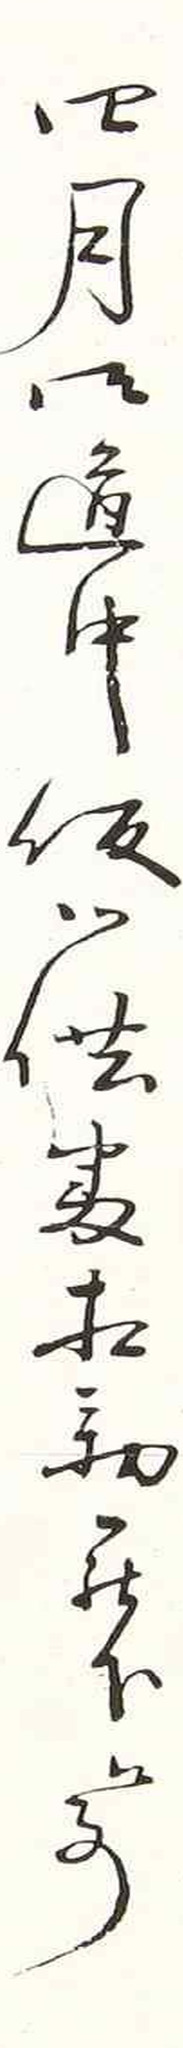四月御道中仮御供番相勤罷下候事
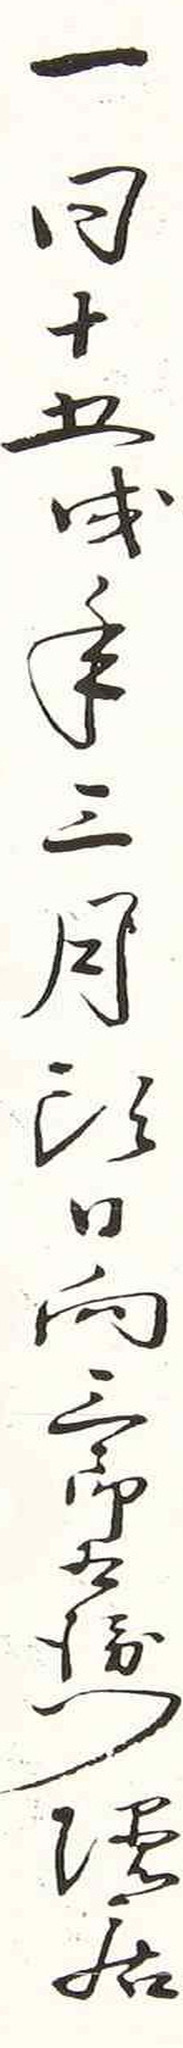一同十五戌年三月頭日向三郎右衛門隠居
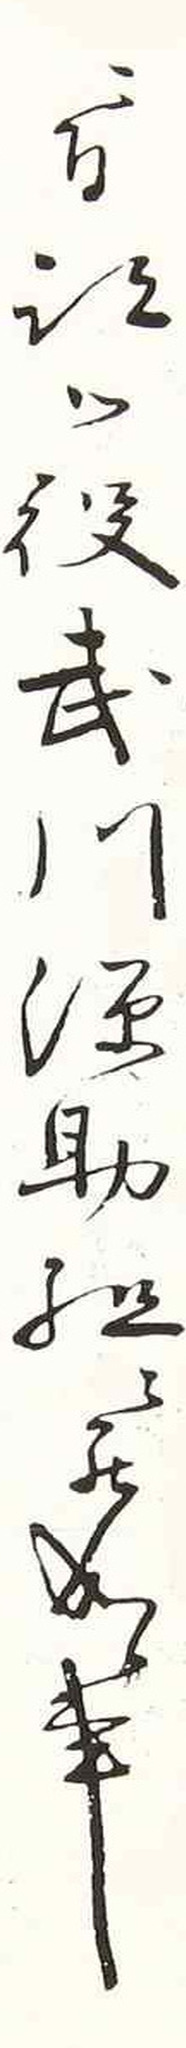ニ付跡役武川源助組ニ罷成候事
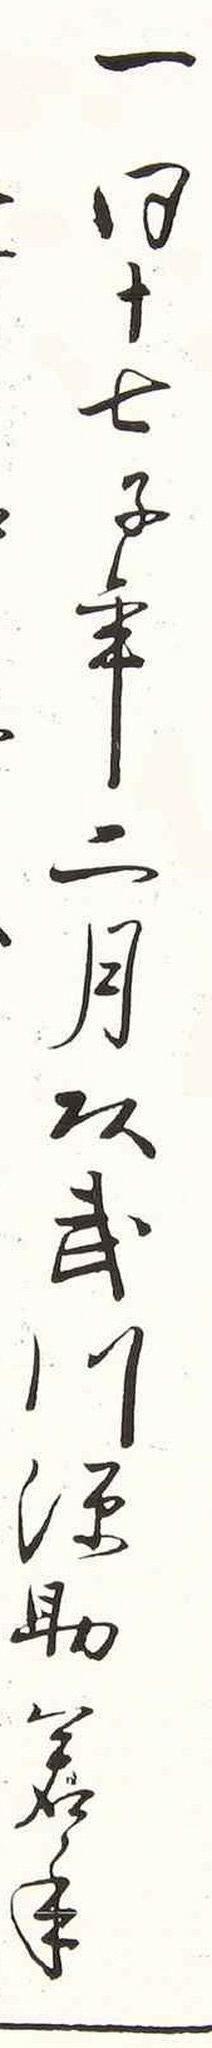一同十七子年二月頭武川源助若年
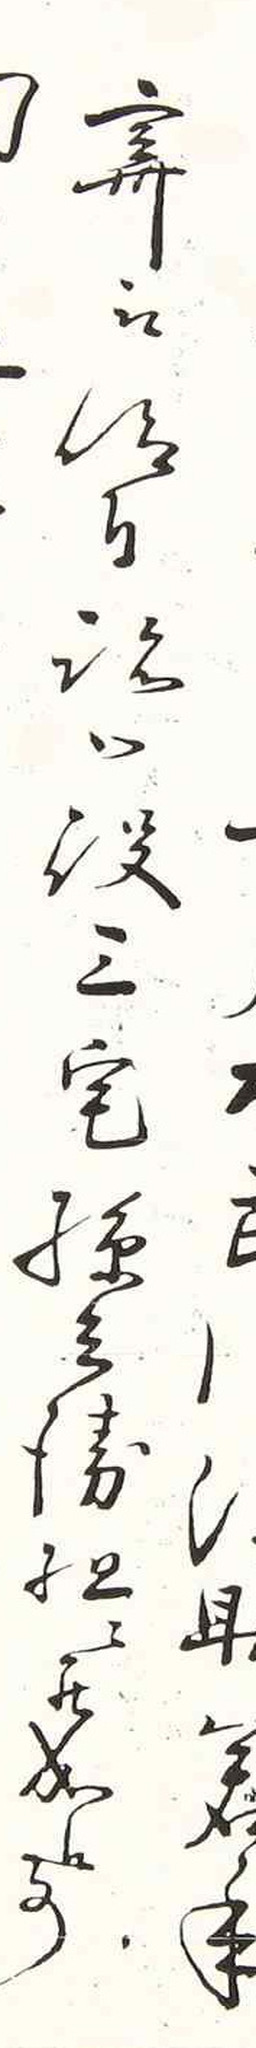寄被仰付跡御役三宅孫兵衛組ニ罷成候事
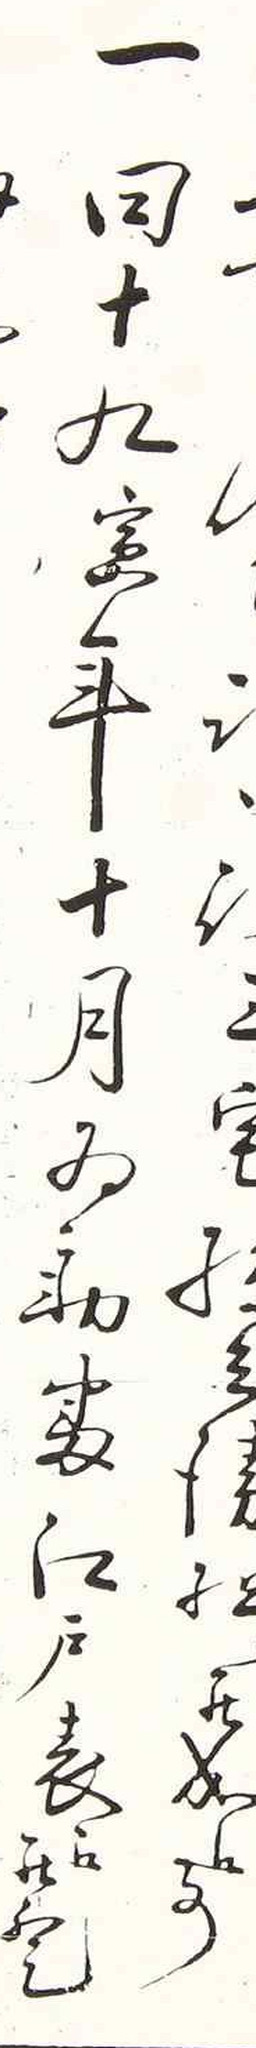一同十九寅年十月為勤番江戸表江罷登
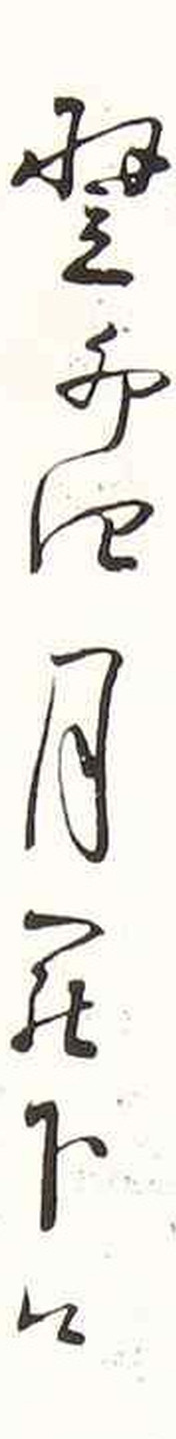翌卯四月罷下候
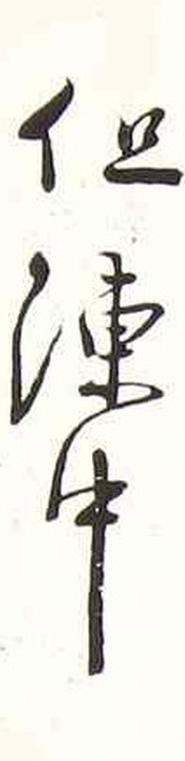但陣中
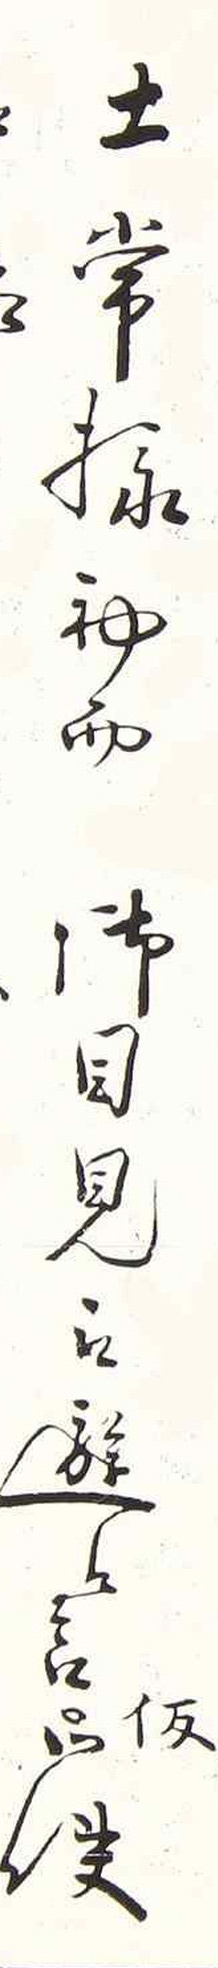土常様初而御目見被遊候節仮御使
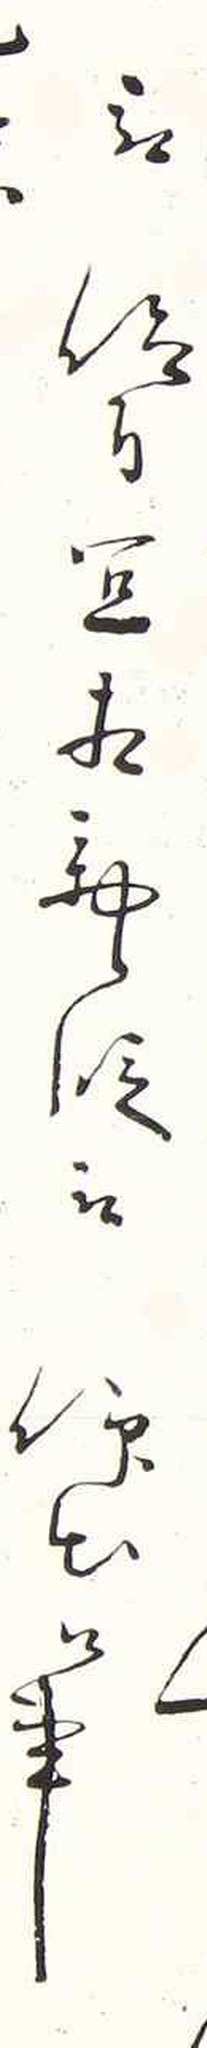被仰付宜相勤候段被仰出候事
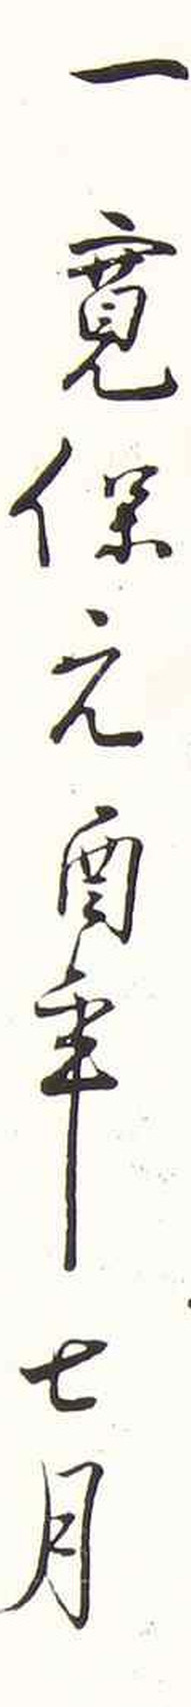一寛保元酉年七月
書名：諸士系譜　巻之357　す之部7
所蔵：会津若松市立会津図書館
